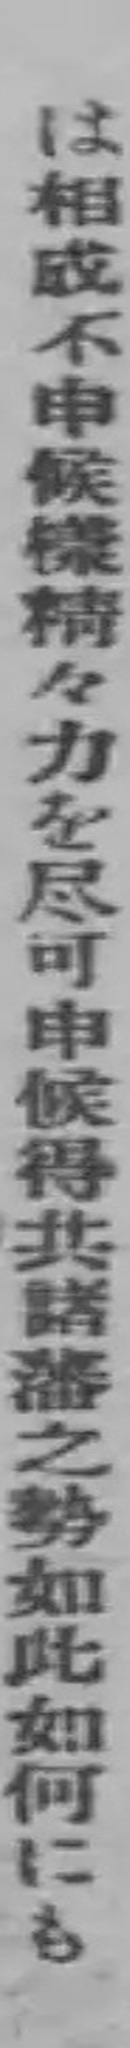は相成不都申候様精々力を尽可申候得共緒藩之勢如此如何にも
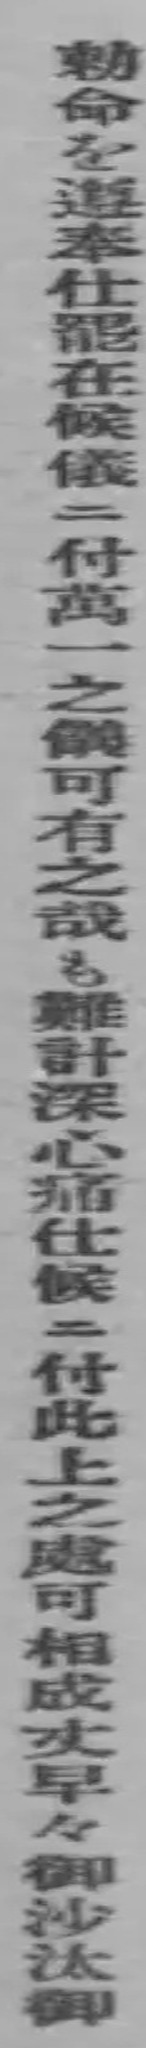勅命を遵奉仕罷在候儀ニ付萬一之儀可有之哉も難計深心痛仕候ニ付此上之処可相成丈早々御沙汰御

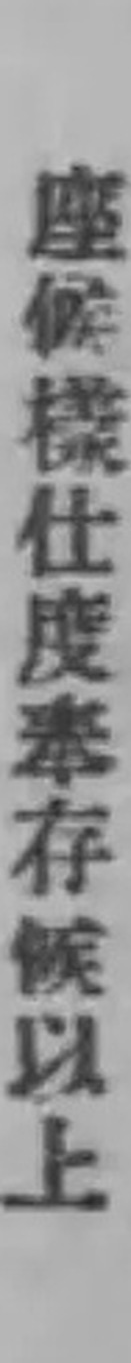座候様仕度奉存候以上
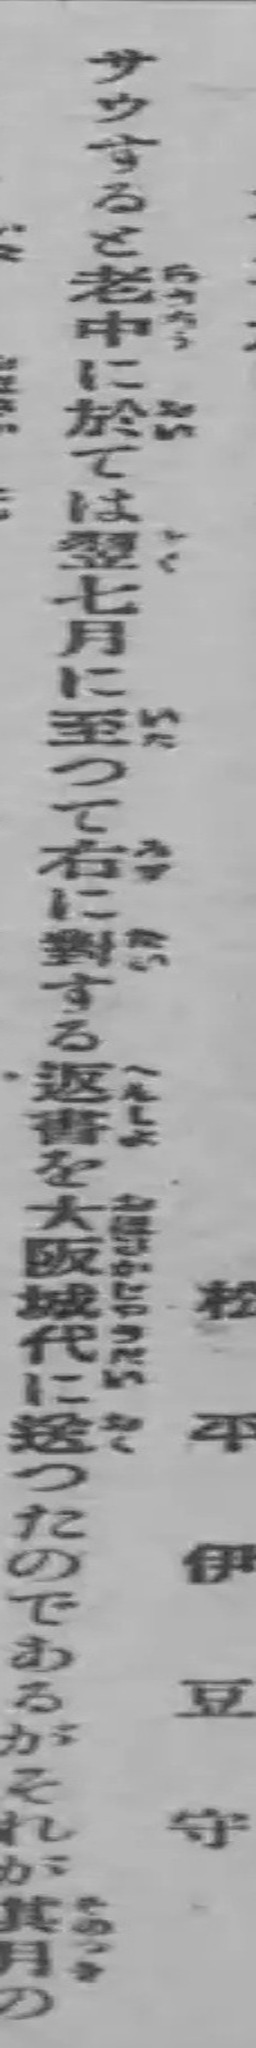サウすると老中に於ては翌七月に至つて右に対する返書を大阪城代に送つたのであるがそれが其月の
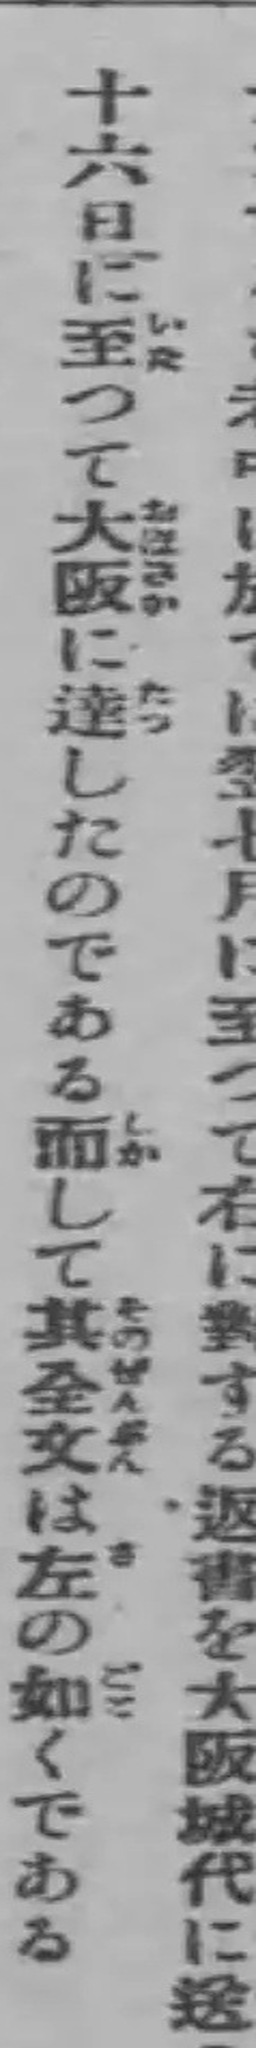十六日に至つて大阪に達したのである而して其全文は左の如くである
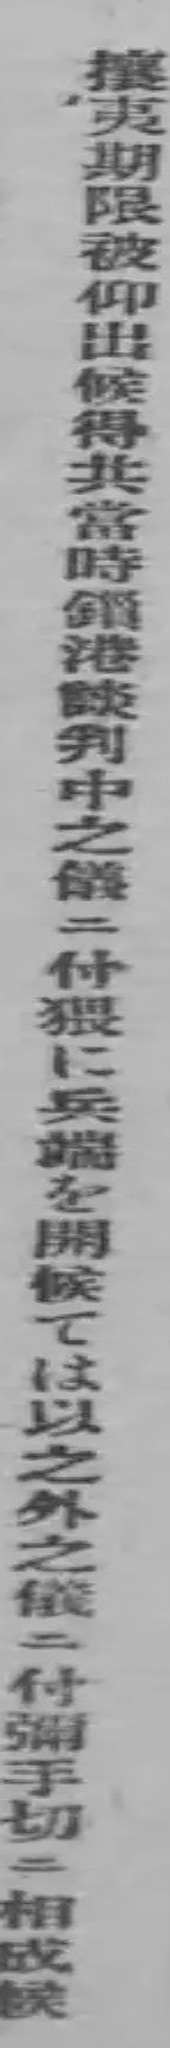攘夷期限被仰出候得共当時鎖港談判中之儀ニ付猥に兵端を開候ては以之外之儀ニ付彌手切ニ相成候
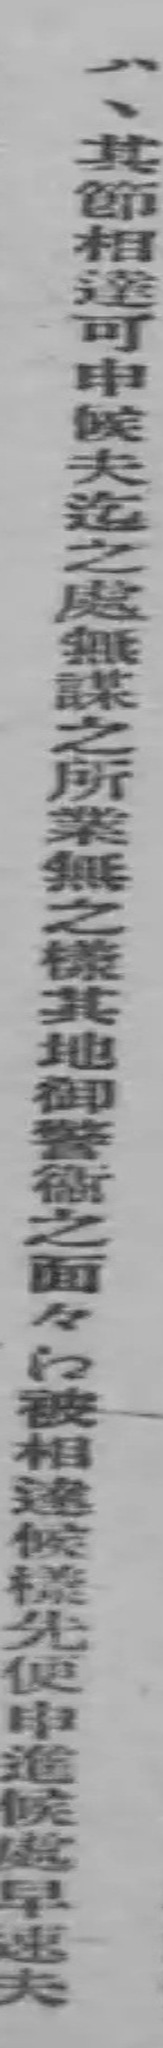ハヽ其節相達可申候夫迄之処無謀之所業無之様其地御警衛之面々え被相達候様先便申進候処早速夫
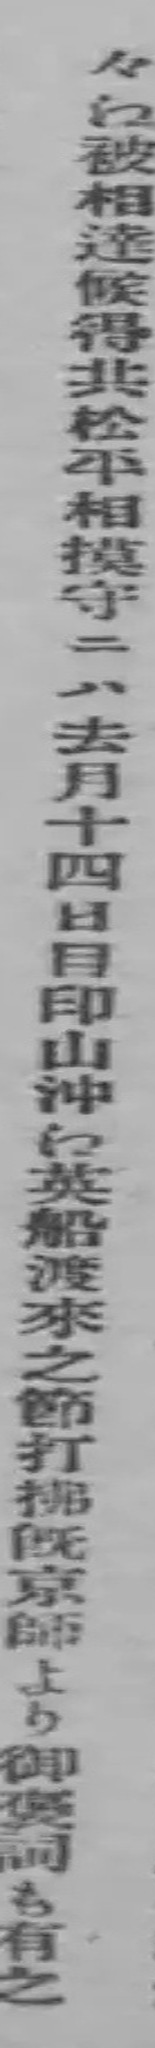々え被相達候得共松平相摸守ニハ去月十四日目印山沖え英船渡来之節打払既京師より御褒詞も有之
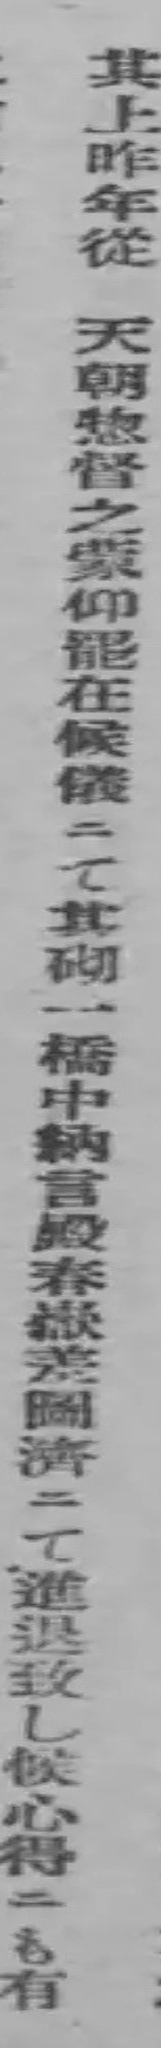其上昨年従天朝惣督之蒙仰罷在候儀ニて其砌一橋中納言殿春嶽差図済ニて進退致し候心得ニも有
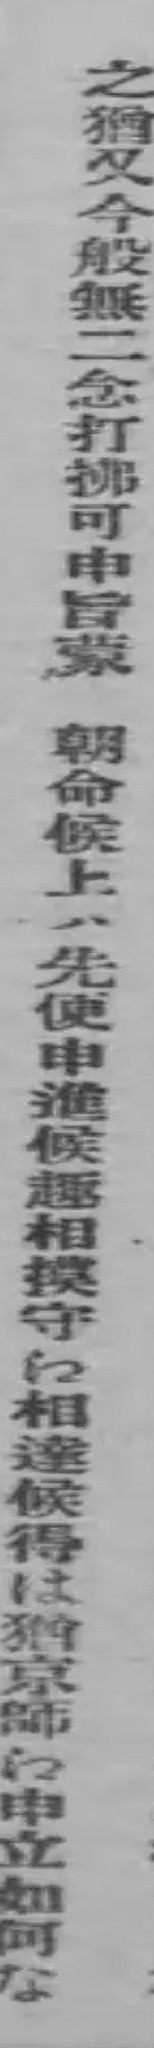之猶又今般無二念打払可申旨蒙朝命候上ハ先便申進候趣相摸守え相達候得は猶京師え申立如何な
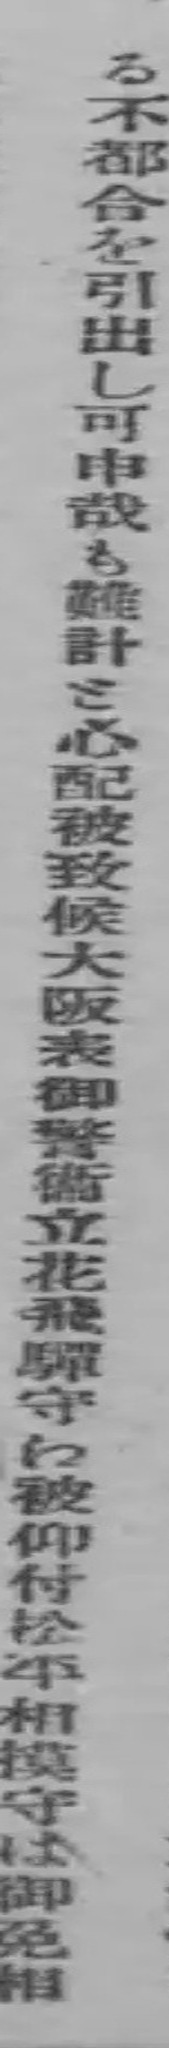る不都合を引出し可申哉も難計と心配被致候大阪表御警衛立花飛騨守え被仰付松平相摸守は御免相
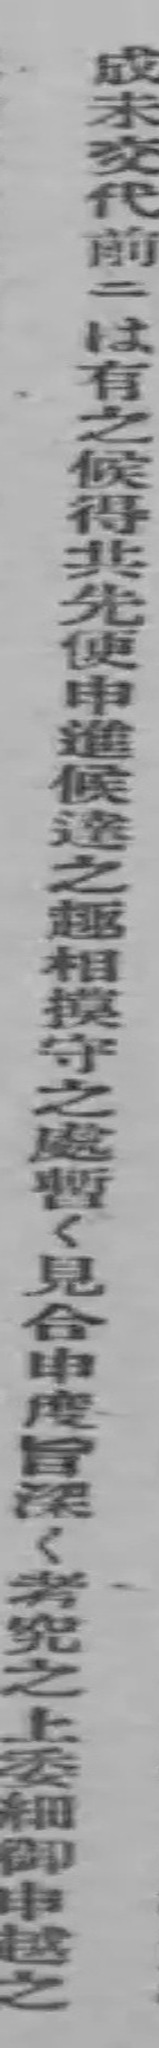成未交代前ニは有之候得共先便申進候達之趣相摸守之処暫く美合申度旨深く考究之上委細御申越之
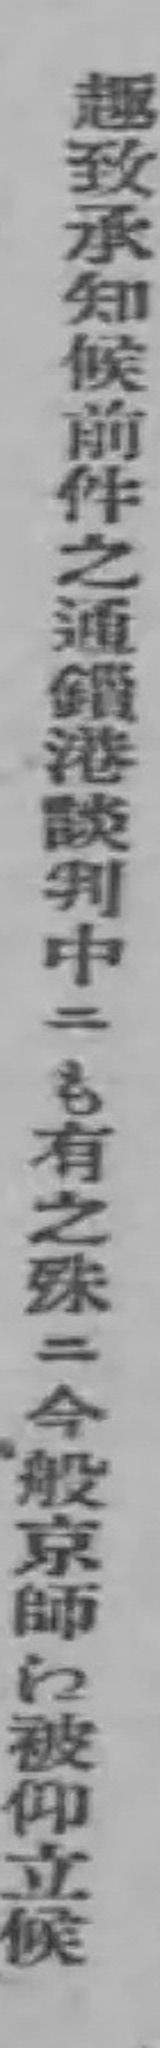趣致承知候前件之通鎖港談判中ニも有之殊ニ今般京師え被仰立候
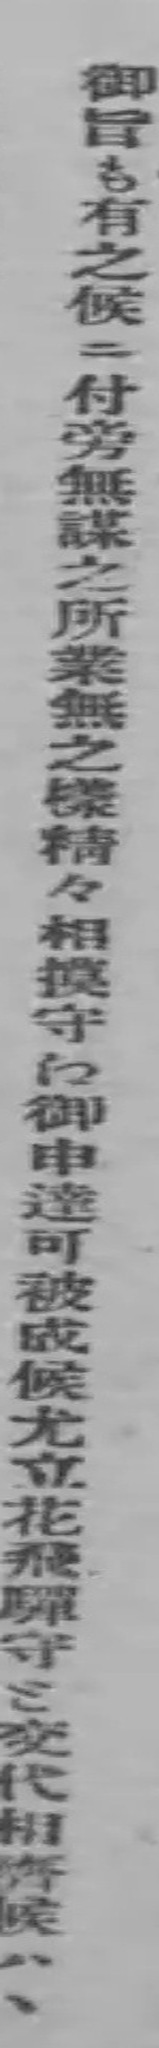御旨も有之候ニ付旁無謀之所業無之様精々相摸守え御申達可被成候尤立花飛騨守と交代相済候ハヽ
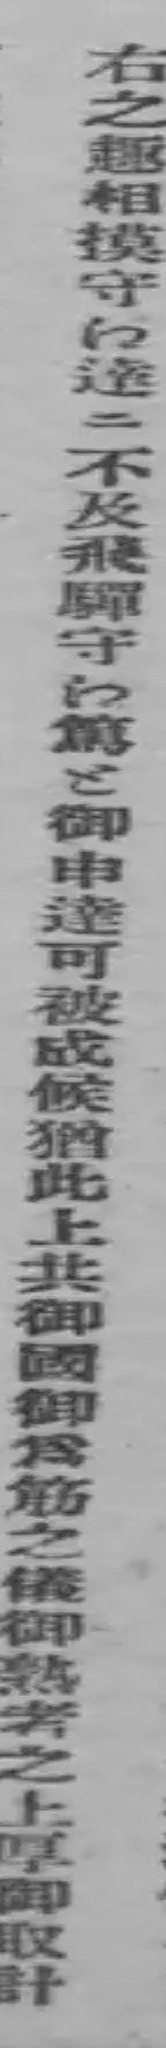右之趣相摸守え達ニ不及飛騨守え篤と御申達可被成候猶此上共御国御為筋之儀御熟者之上厚御取計
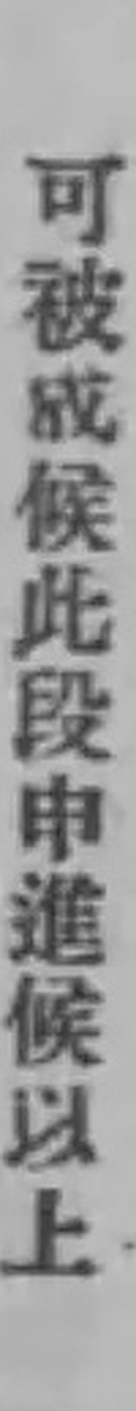可被成候此段申進候以上
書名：豊橋市史談
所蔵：国立国会図書館 National Diet Library, JAPAN
